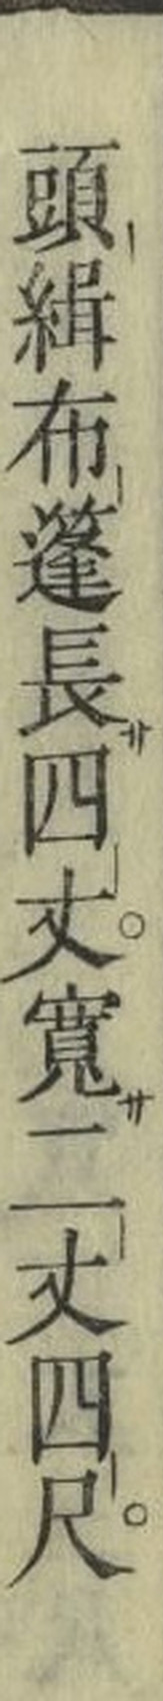頭-緝布-篷長四-丈。寬二-丈四-尺。
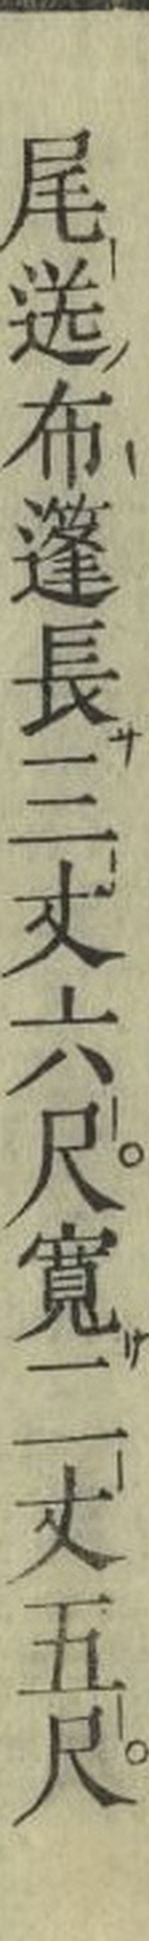尾-送布-篷長三-丈六-尺。寬二-丈五-尺。
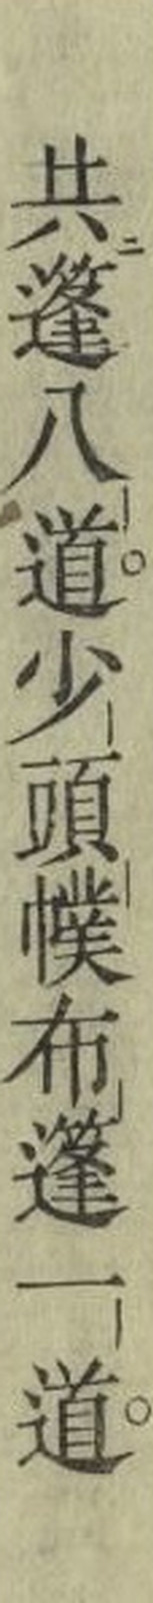共篷八-道。少-頭-幞布-篷一-道。
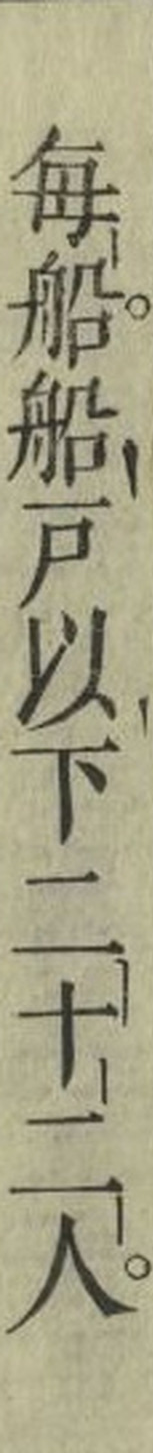每-船。船-戸以-下二-十-二-人。
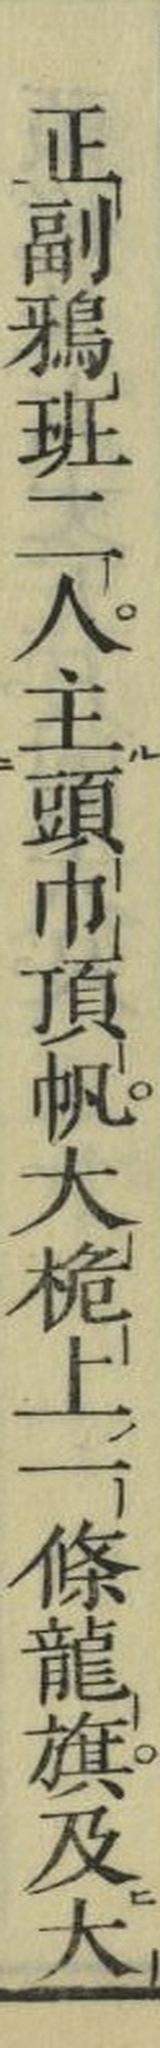正-副鴉-班二-人。主頭-巾-頂-帆。大-桅-上一-條龍-旗。及大-
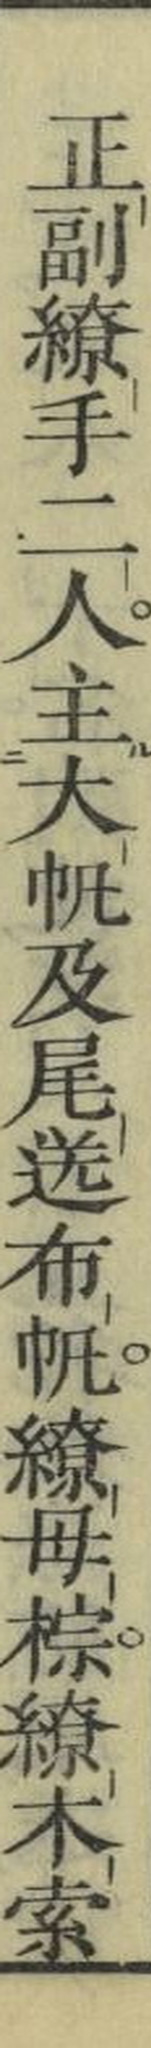正-副繚-手二-人。主大-帆及尾-送布-帆。繚-母-棕。繚-木-索
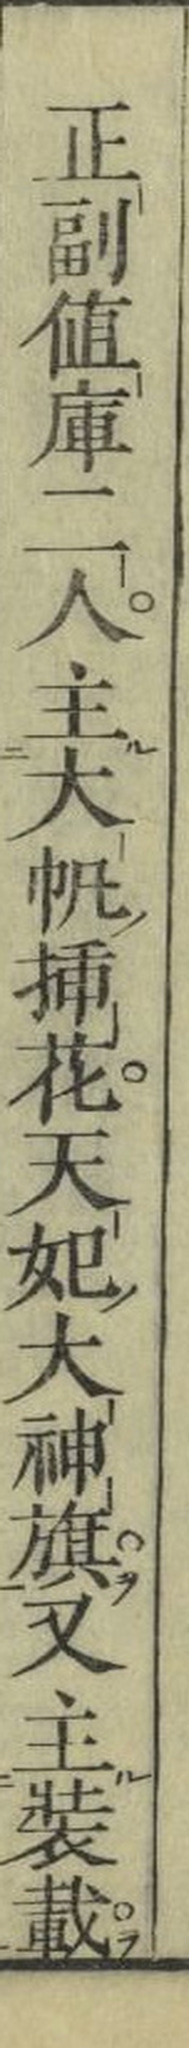正-副値-庫二-人。主大-帆挿-花。天-妃大-神-旗。又主裝載。

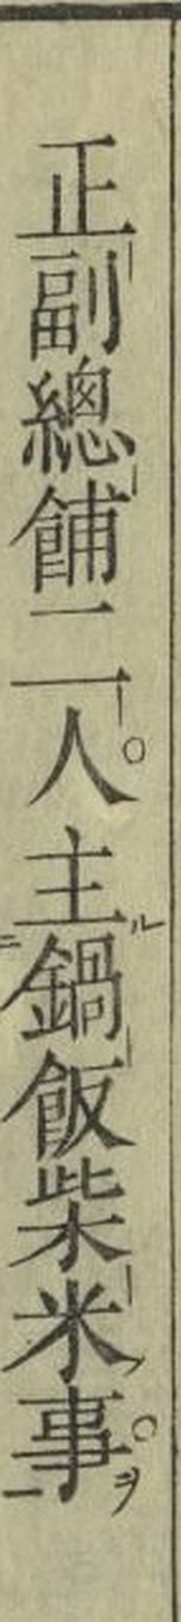正-副總-餔二-人。主鍋-飯柴-米事。
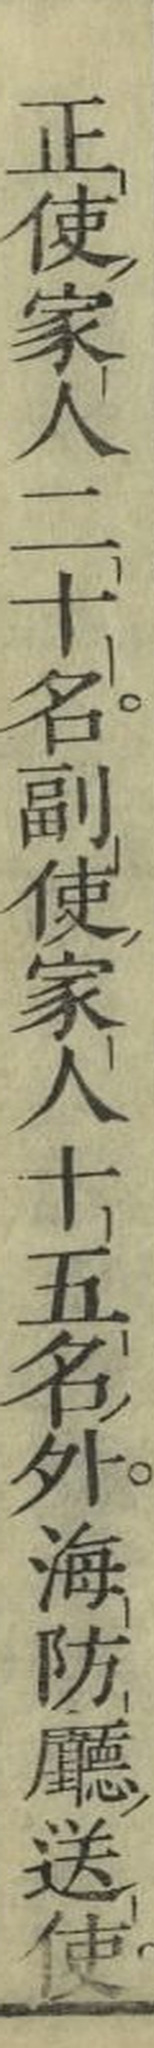正-使家-人二-十-名。副-使家-人十-五-名外。海-防-㕔送-使。
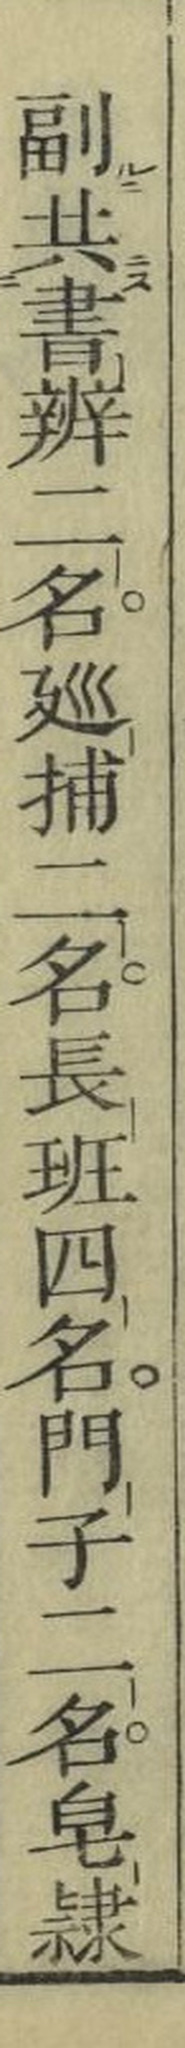副共書-辨二-名。廵-捕二-名。長-班四-名。門-子二-名。皂-隷
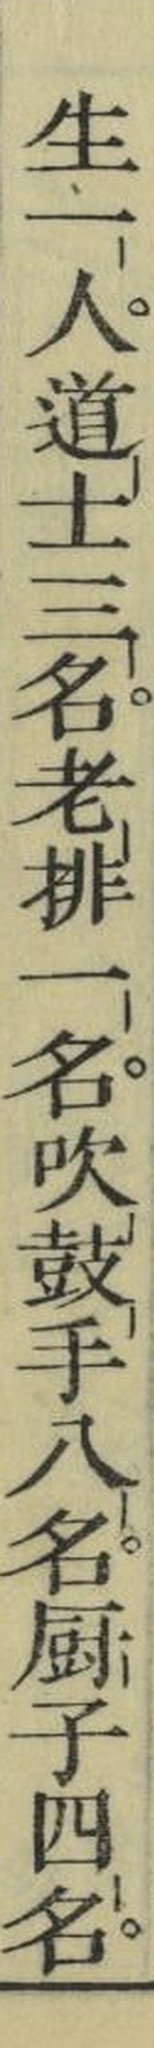生一-人。道-士三-名。老-排一-名。吹-鼓-手八-名。厨-子四-名。
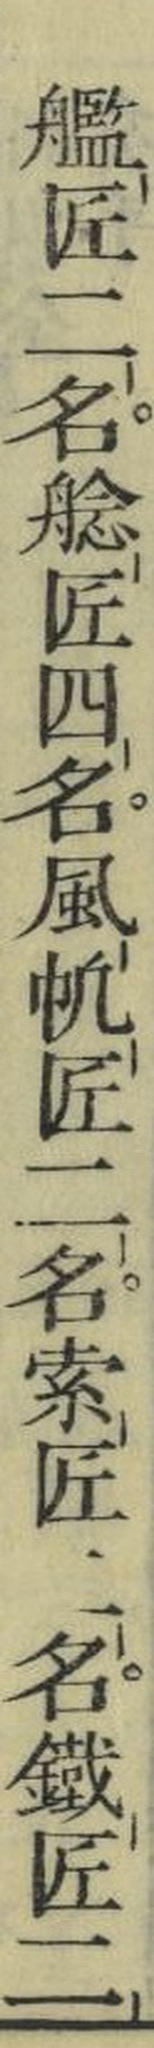艦-匠二-名。艌-匠四-名。風-帆-匠二-名。索-匠二-名。鐵-匠二-
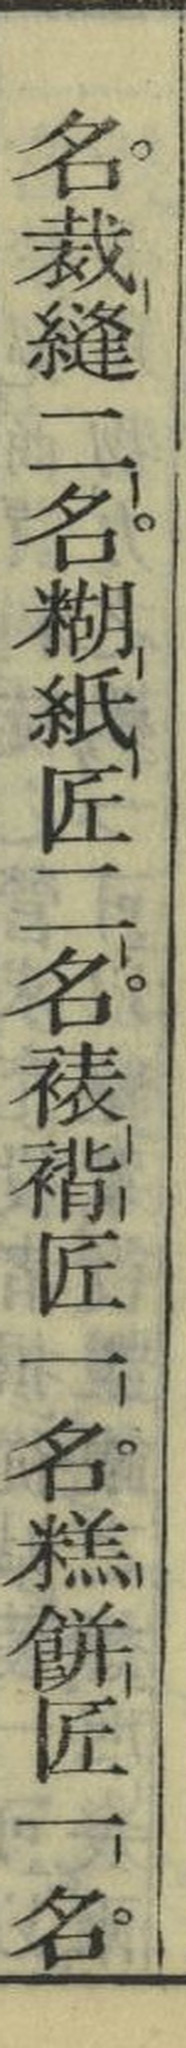名。裁-縫二-名。糊-紙-匠二-名。裱-褙-匠一-名。糕-餅-匠一-名。

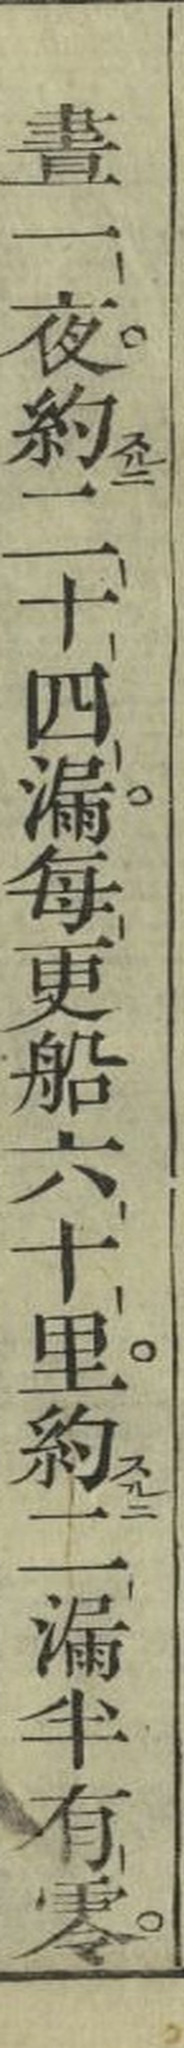晝一-夜。約二-十-四-漏。每-更船六-十-里。約二-漏半有-零。

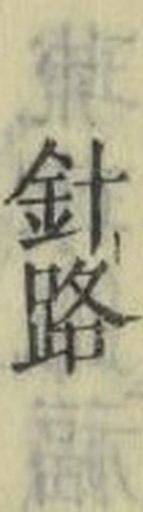針-路

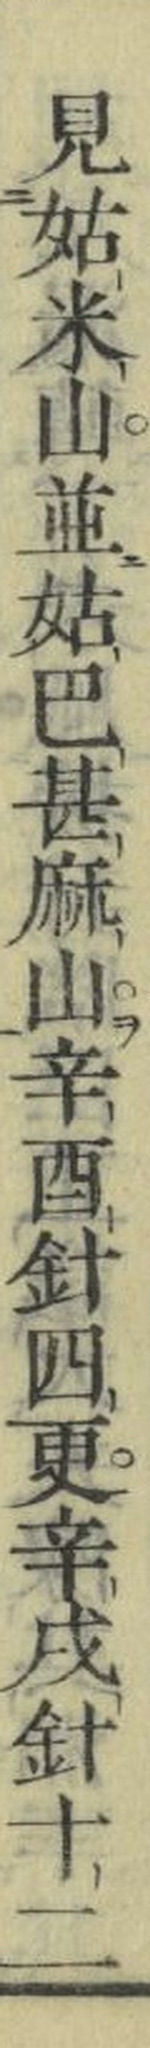見姑-米-山。並姑-巴-甚-麻-山。辛-酉-針四-更。辛-戌-針十-二
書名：中山伝信録 巻一
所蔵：University of the Ryukyus Library
